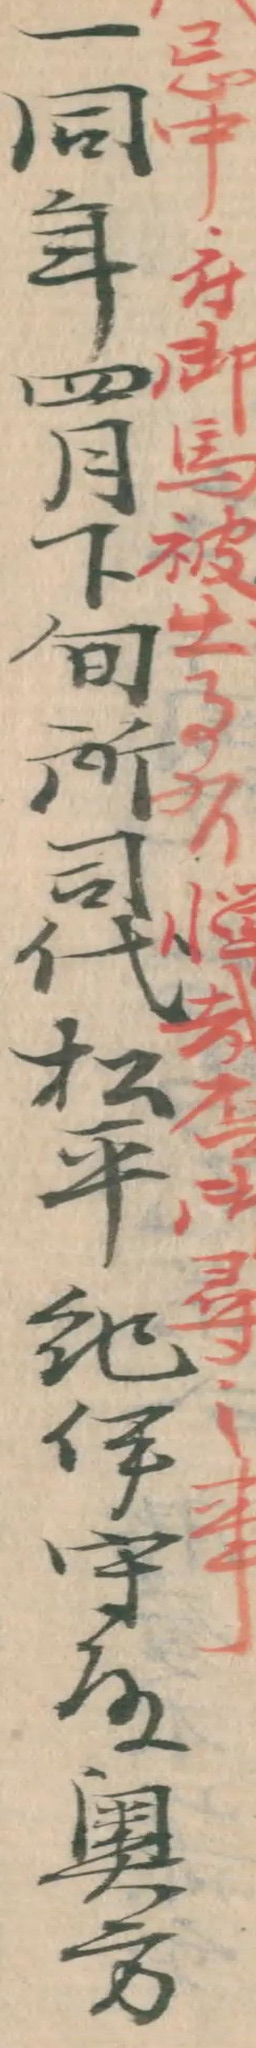一同年四月下旬所司代松平紀伊守殿奥方
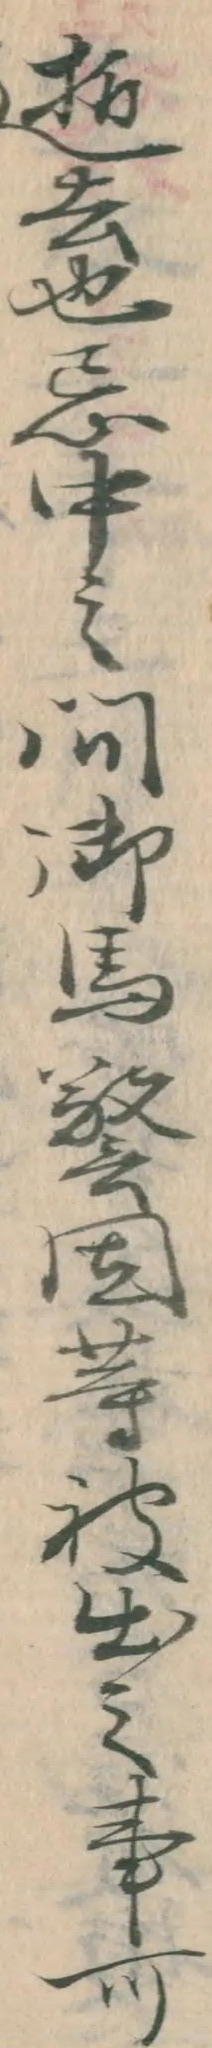逝去也忌中之間御馬警固等被出之事可
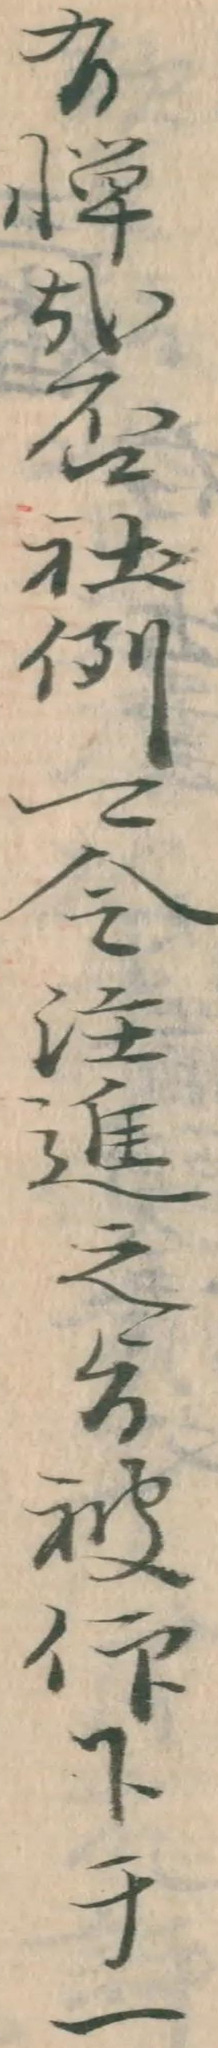有憚哉否社例可令注進之旨被仰下于一
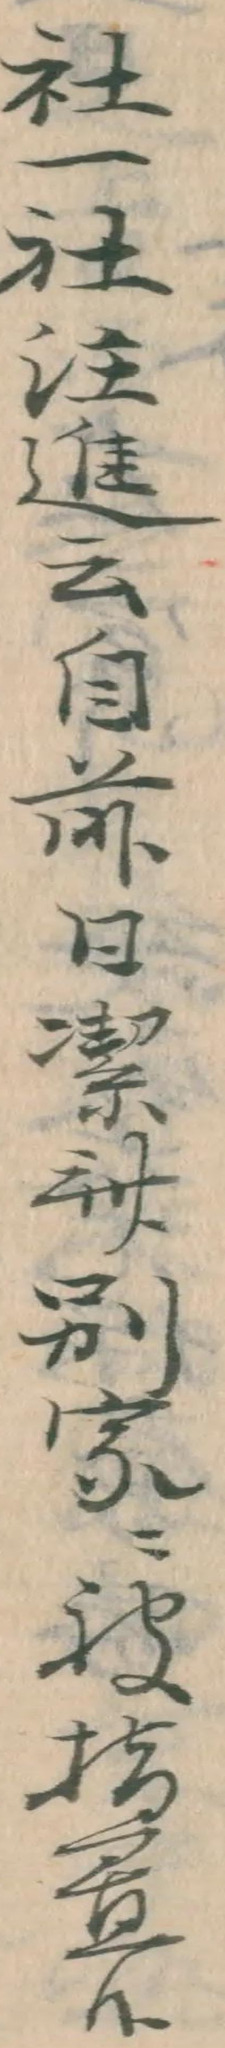社一社注進云自前日潔斎別家ニ被指置候
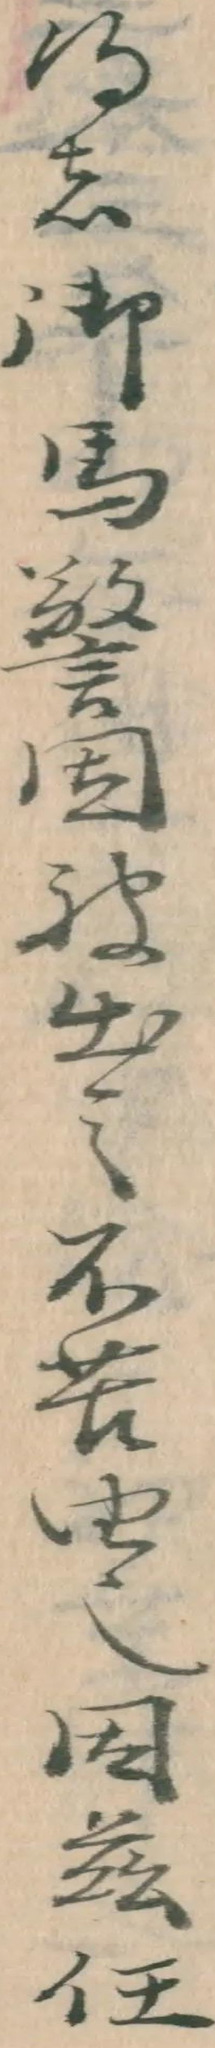得者御馬警固被出之不苦由也因茲任
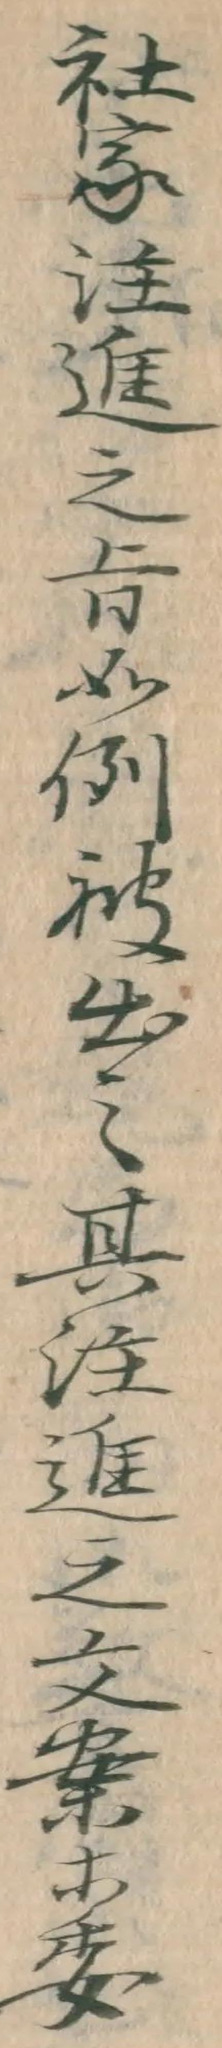社家注進之旨如例被出之其注進之文案等委
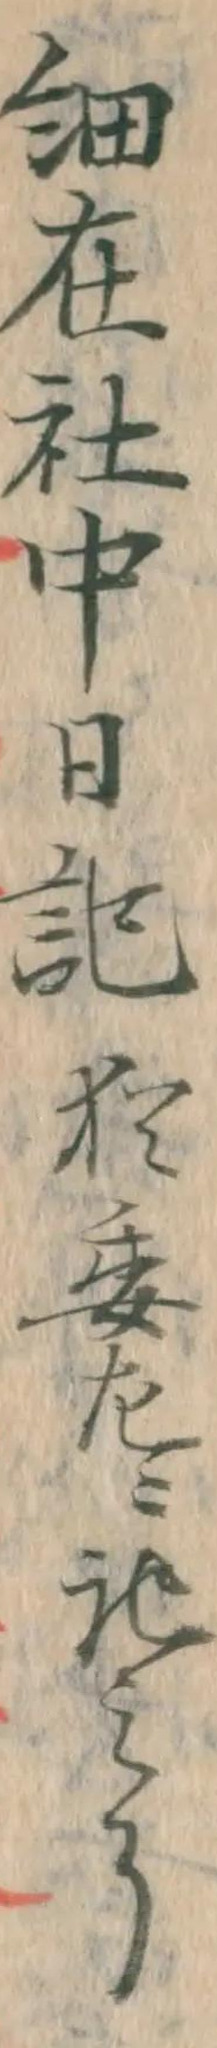細在社中日記猶委左ニ記之了
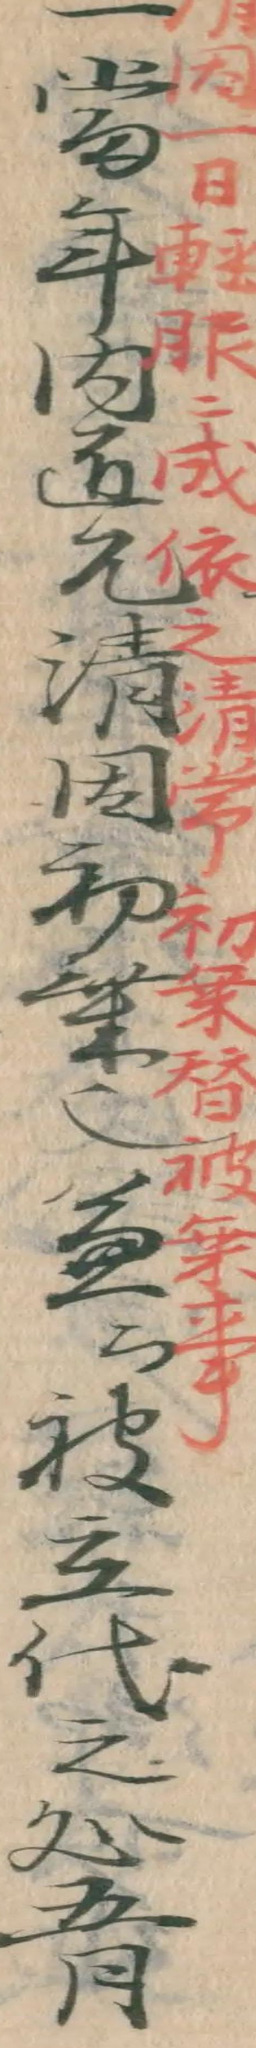一当年内匠允清因初業也兼而被立代之処五月
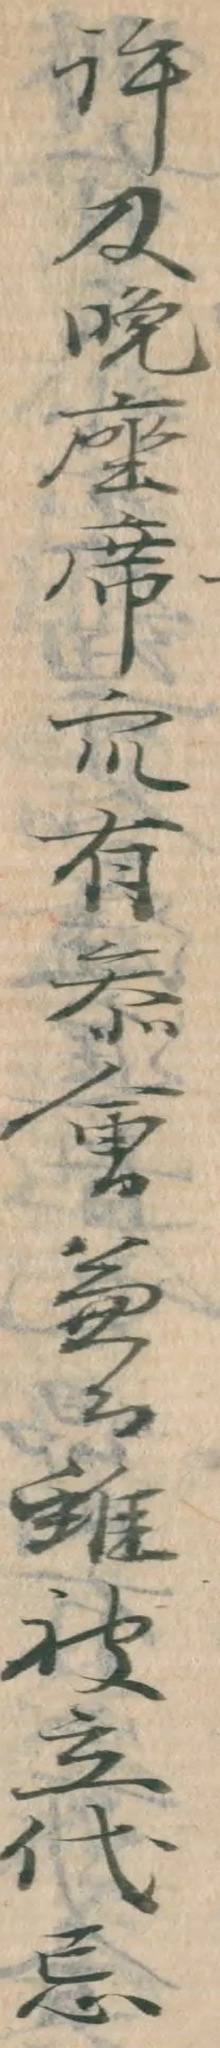許及晩座席衆有参会兼而雖被立代忌
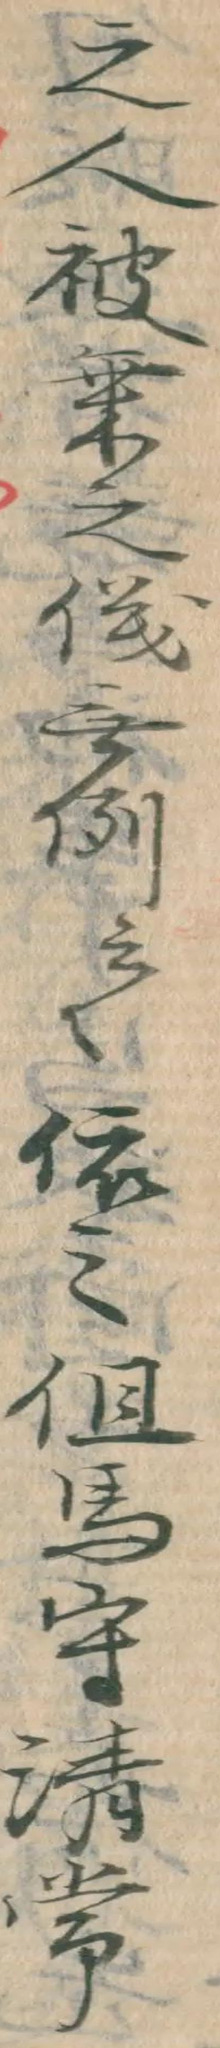之人被乗之儀無例云々依之但馬守清常
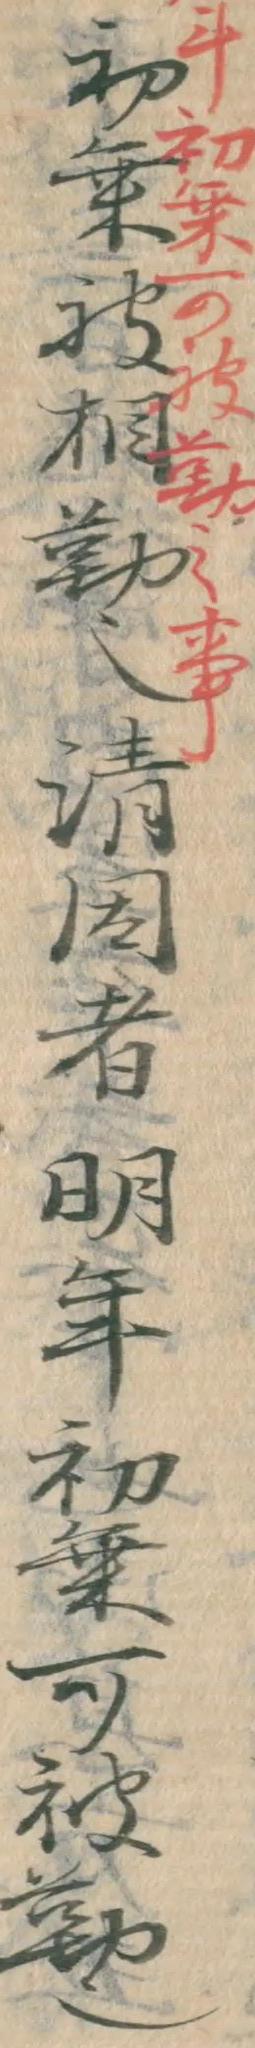初乗被相勤之清因者明年初葉可被勤也
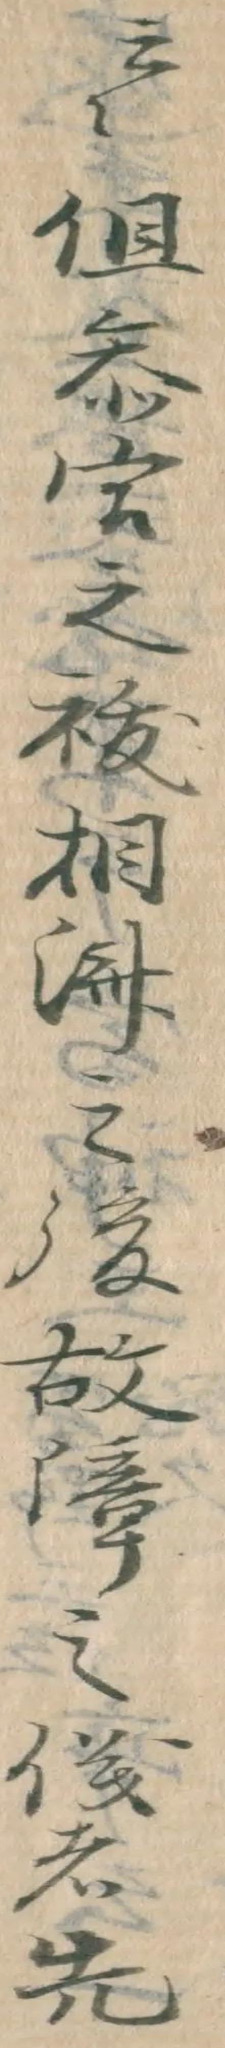云々但参宮之祓相済之後故障之儀者先
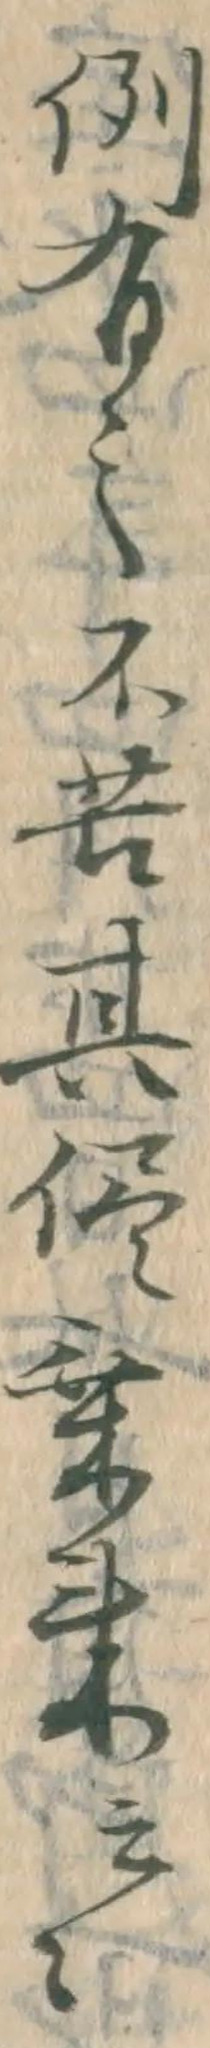例有之不苦其侭乗来云々

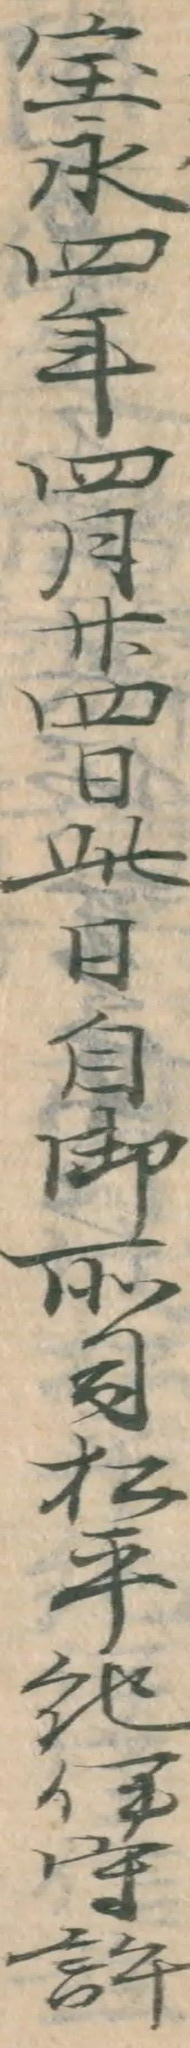宝永四年四月廿四日此日自御所司松平紀伊守許
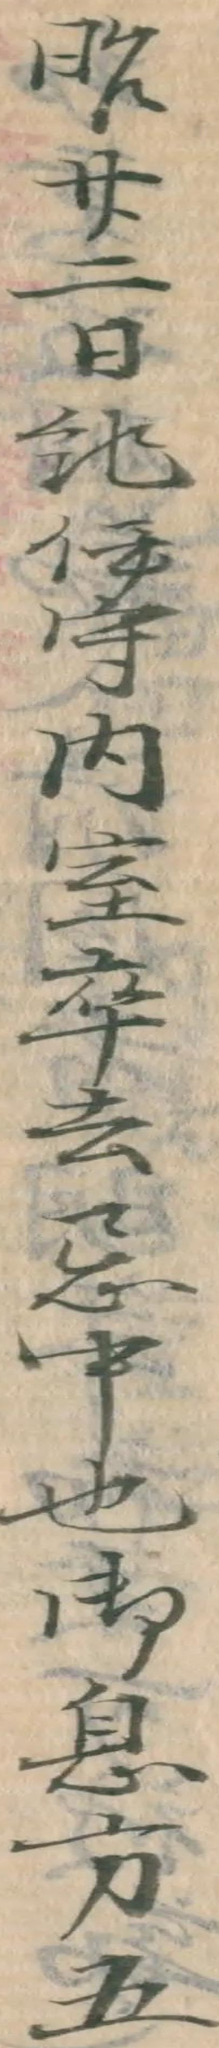昨廿二日紀伊守内室卒去忌中也御息方五
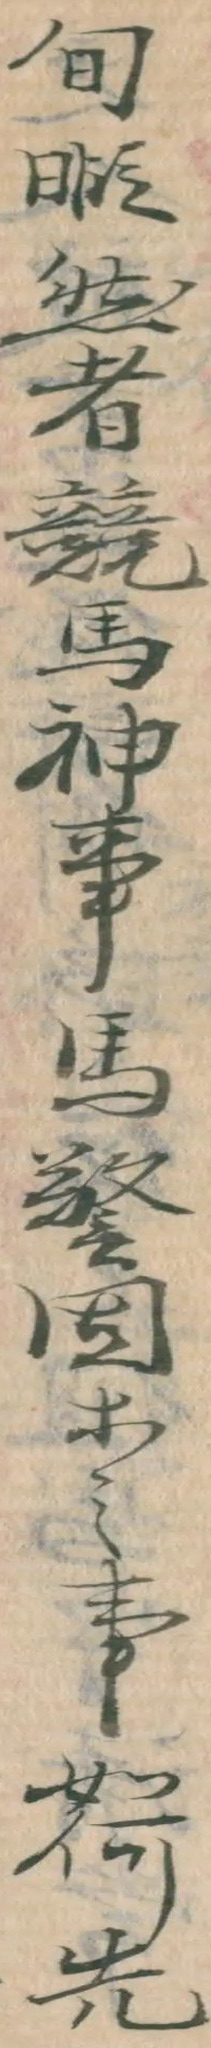旬暇然者競馬神事馬警固等之事如何先
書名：賀茂社記録. 第10冊
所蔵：国立国会図書館 National Diet Library, JAPAN
